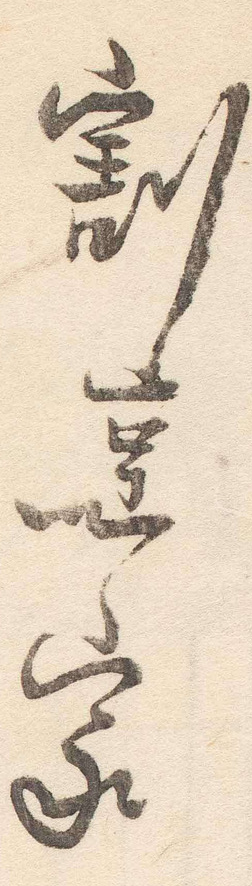割烹家
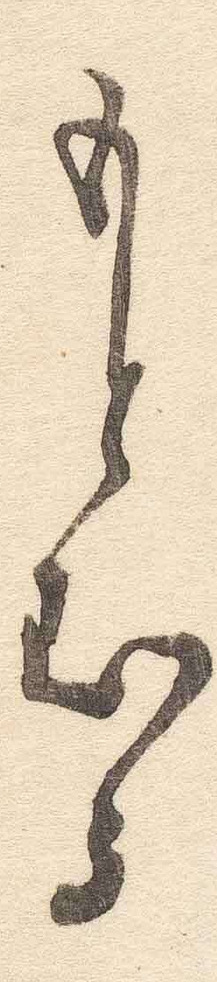もとむる

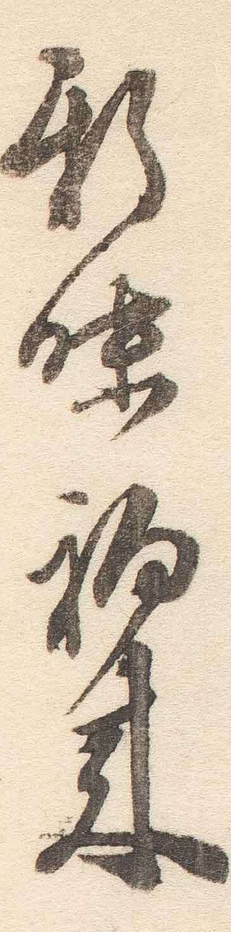新味初来
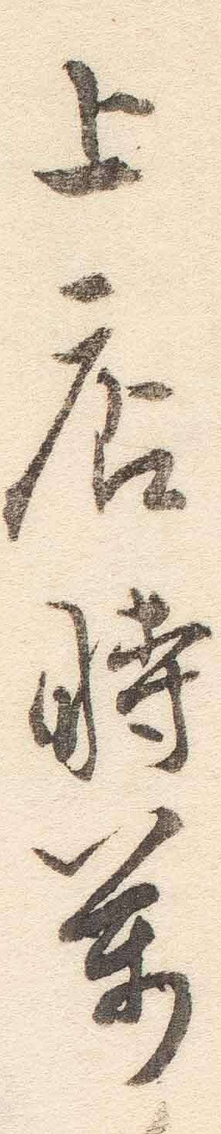上店時万
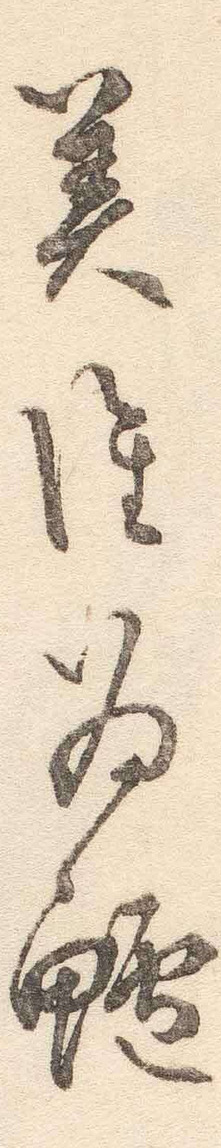美佳為鱸
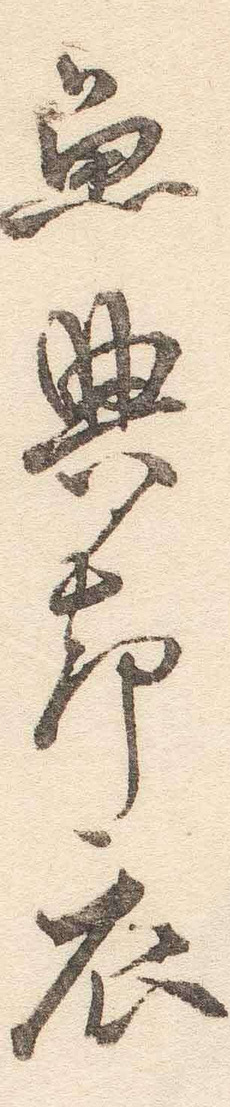魚典却衣

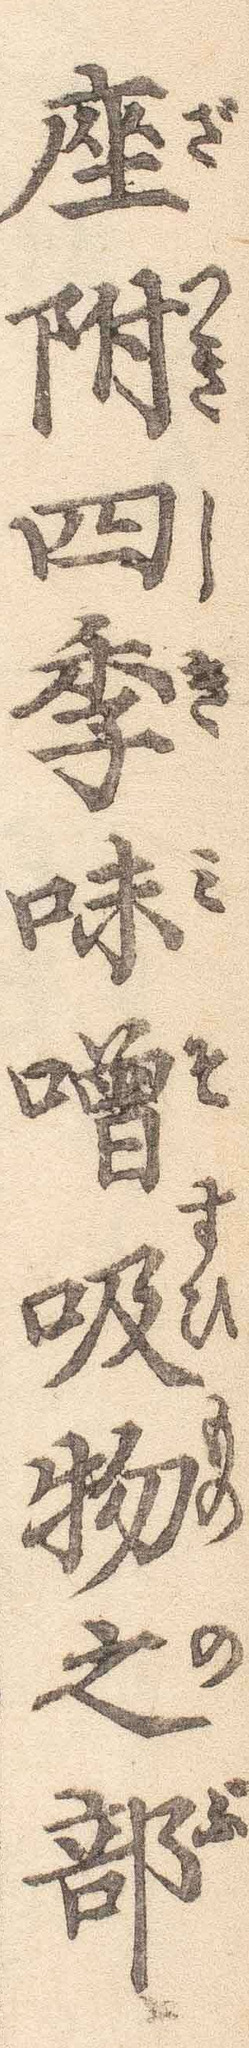座附四季味噌吸物之部
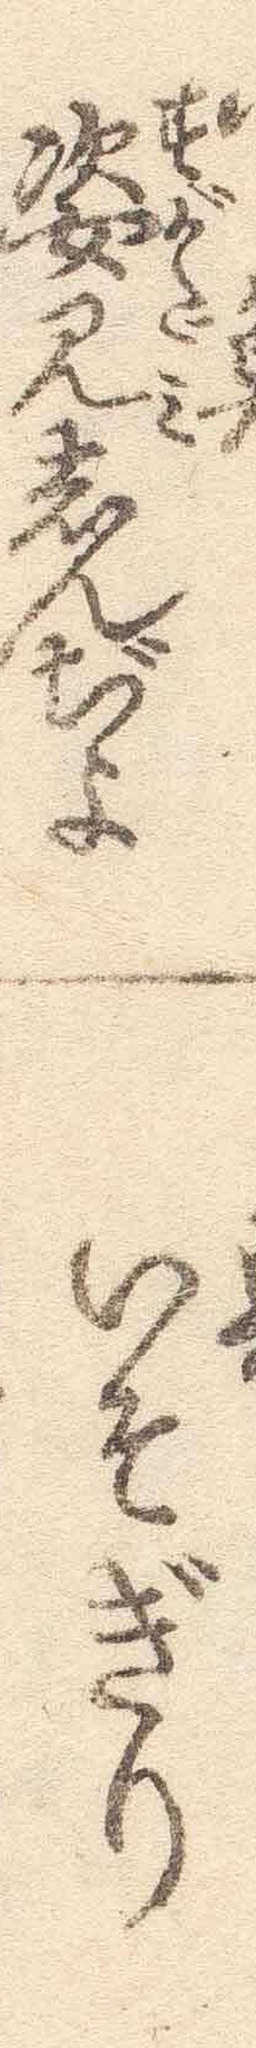姿見しんぢよいそぎり
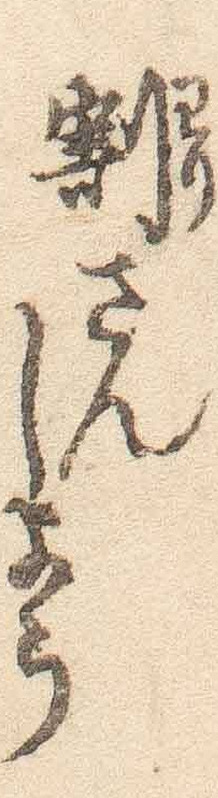さんしよう
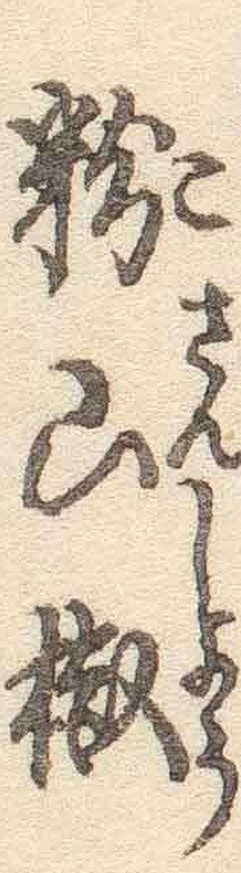粉山椒
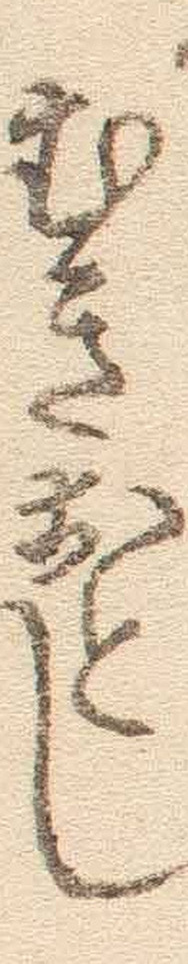むきおとし
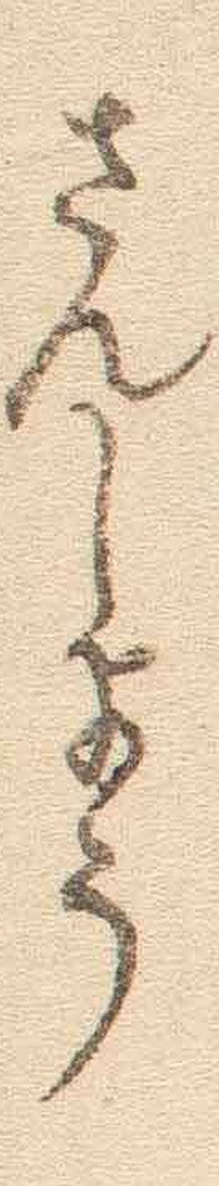さんしよう

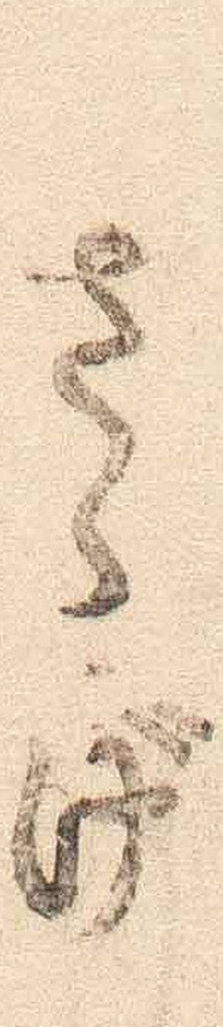さゝげ
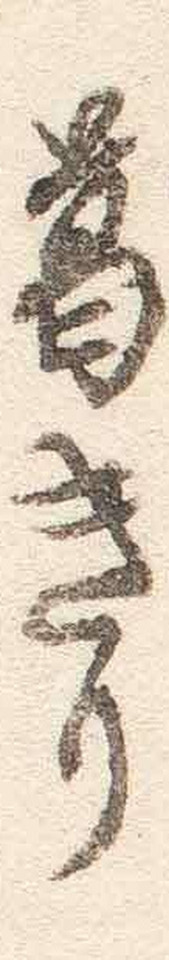葛きり
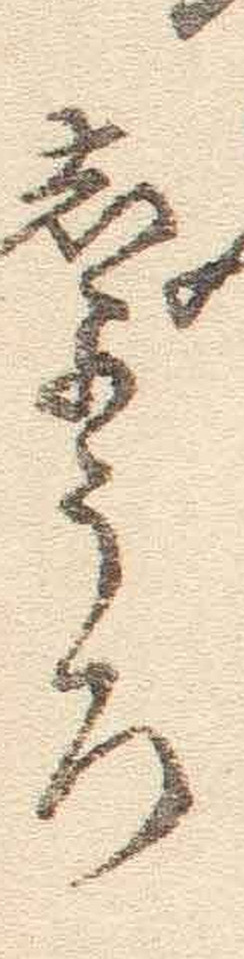しようろ

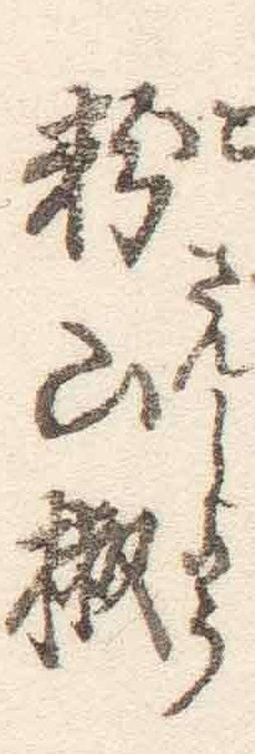粉山椒
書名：料理通
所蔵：東京学芸大学附属図書館 国文学研究資料館
